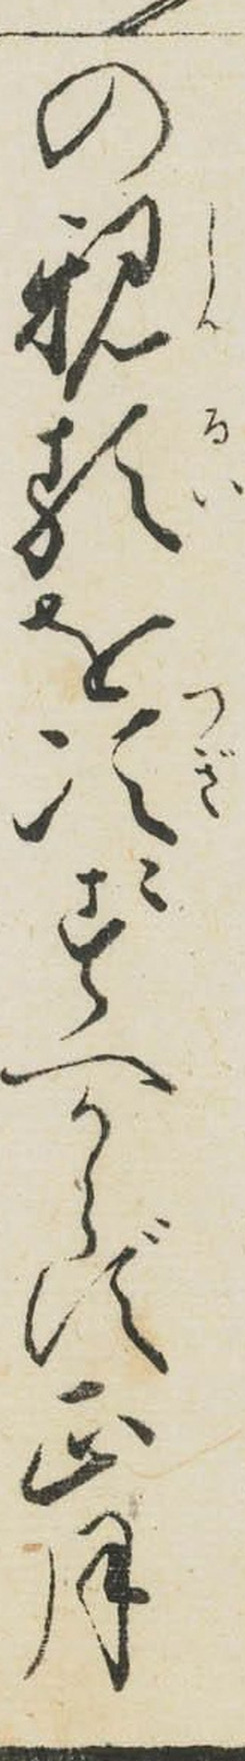の親類を次正月
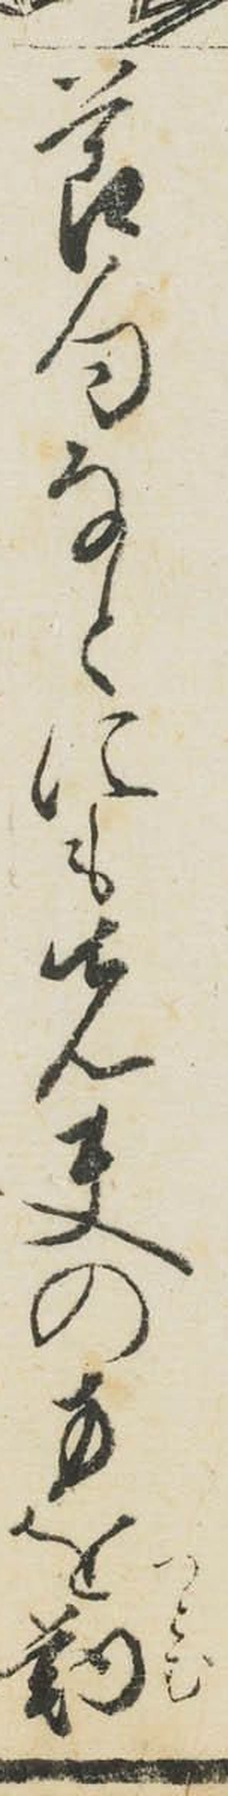節句なとにも先夫の方を勤
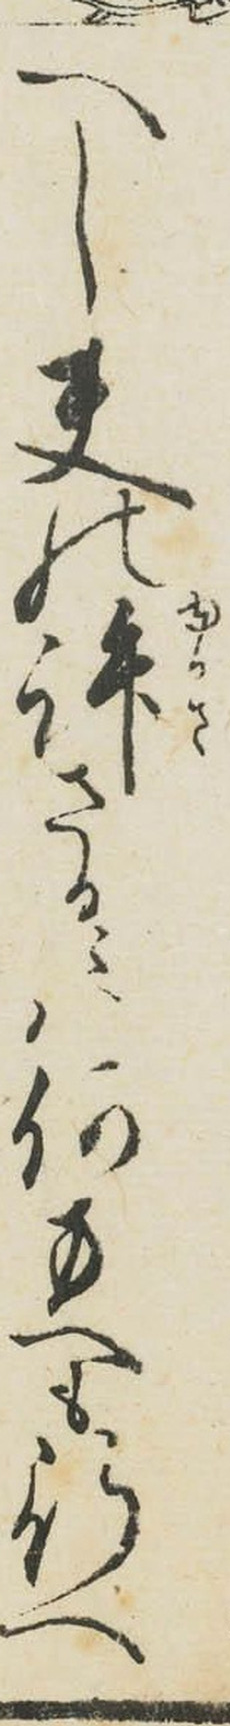へし夫の許さる何方へも行へ
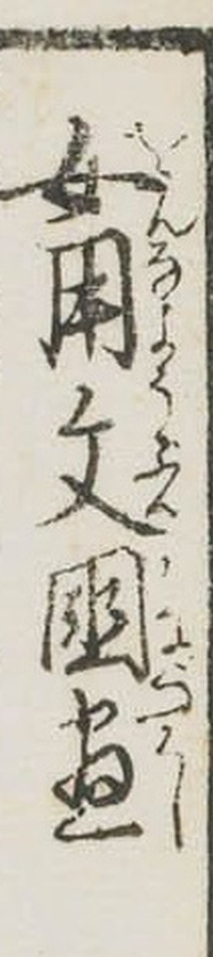女用文国尽
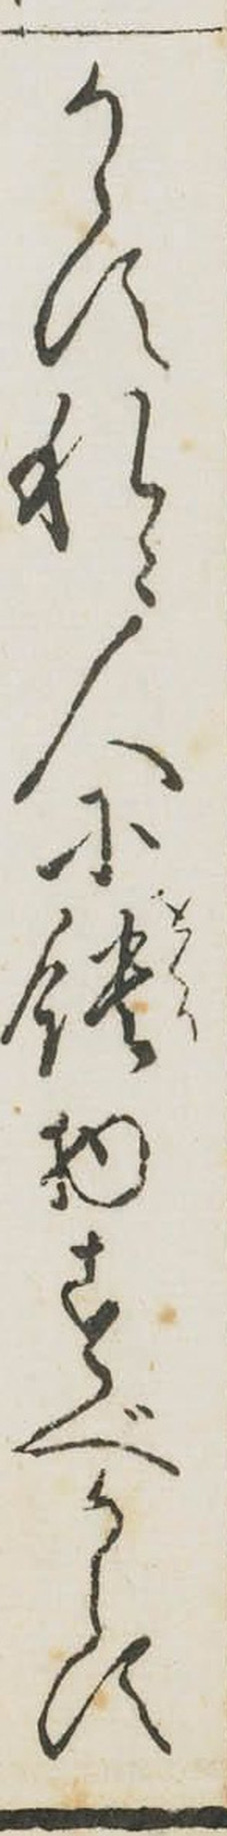からす私人に贈物すべからす
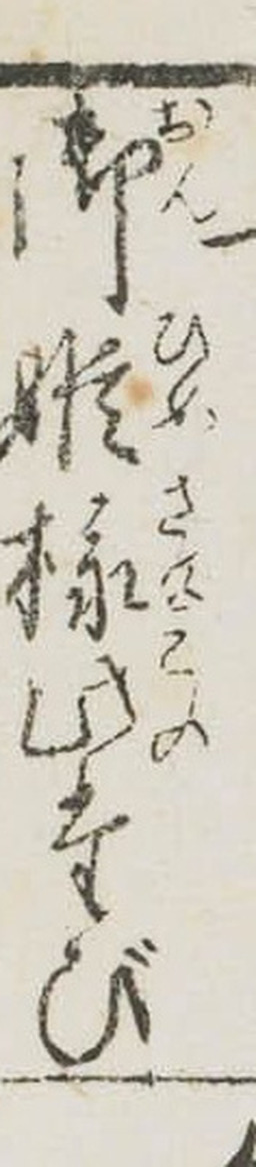御姫様此たび
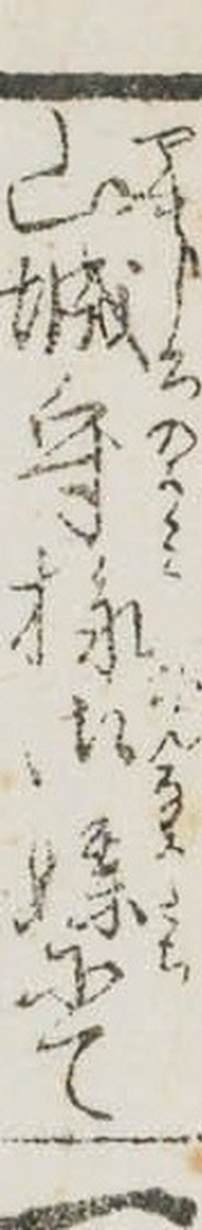山城守様御媒にて
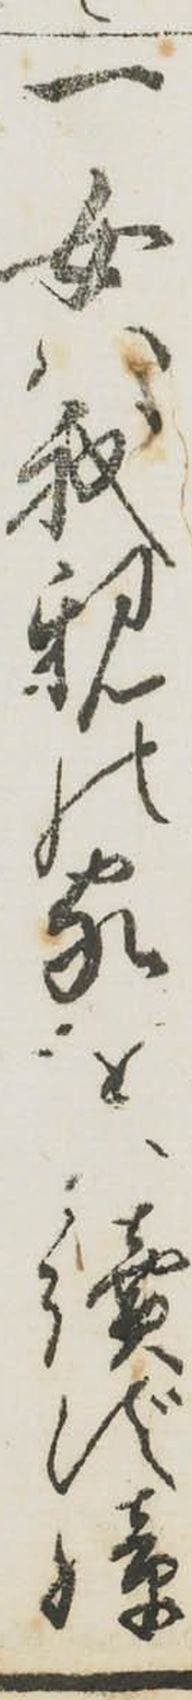一女は我親の家をは続ず嫜
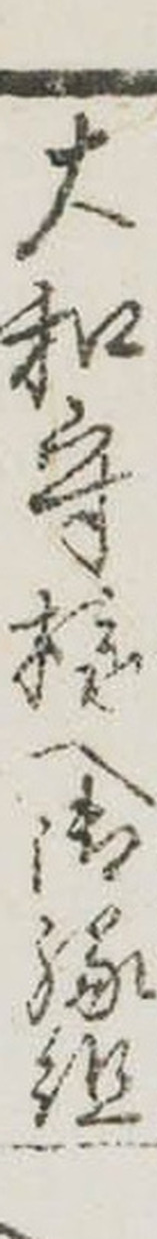大和守様へ御縁組
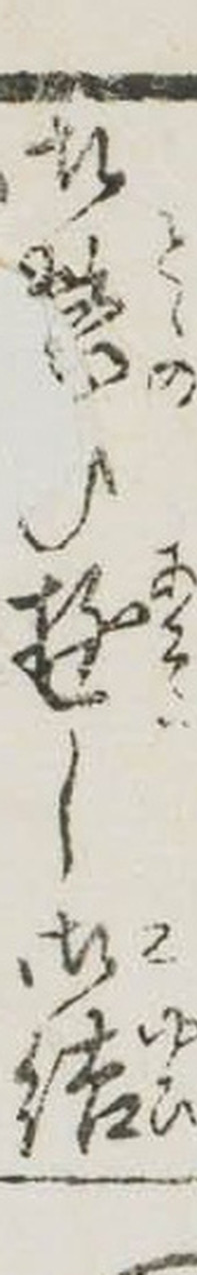御整ひ遊し御結
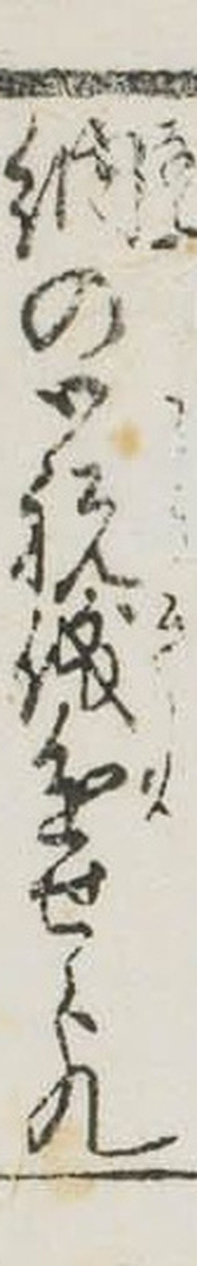納の御祝儀進せられ
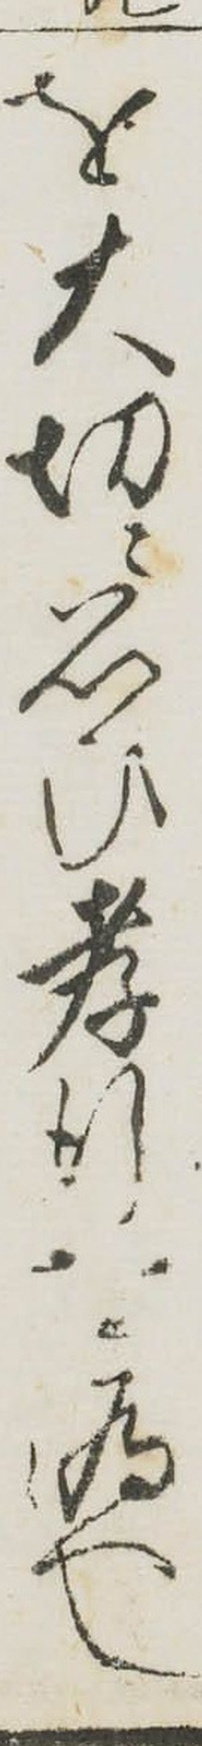を大切思ひ孝行を為へし
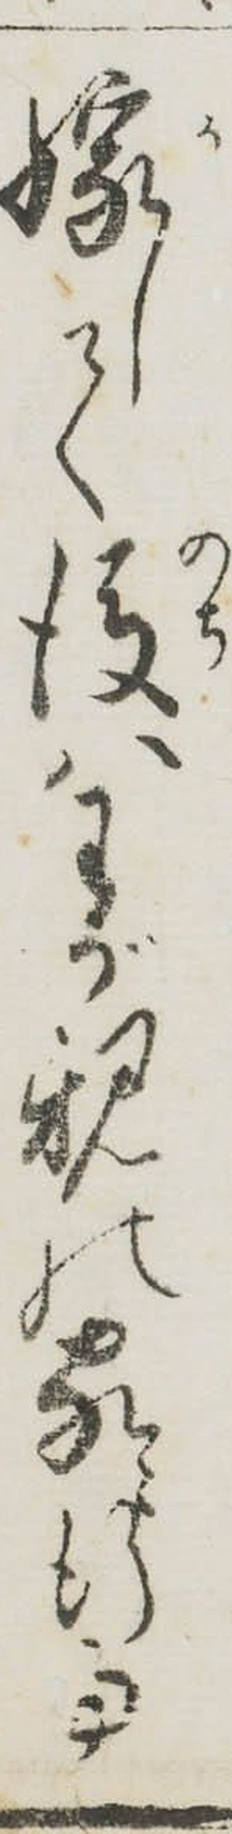嫁して後はわが親の家行事
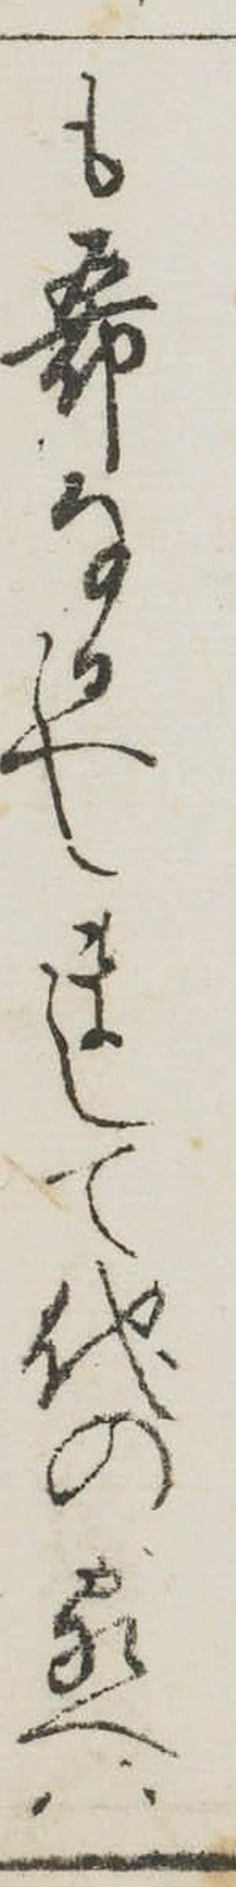も希なるへしまして他の家へは
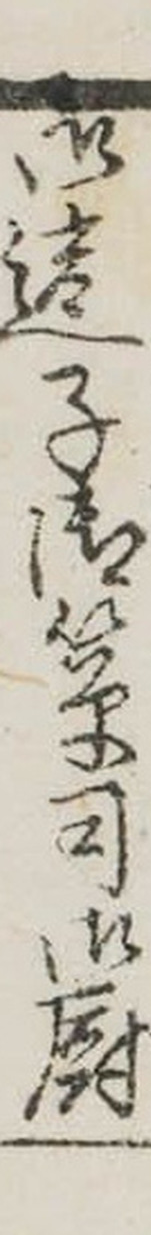御這子御箪笥御厨
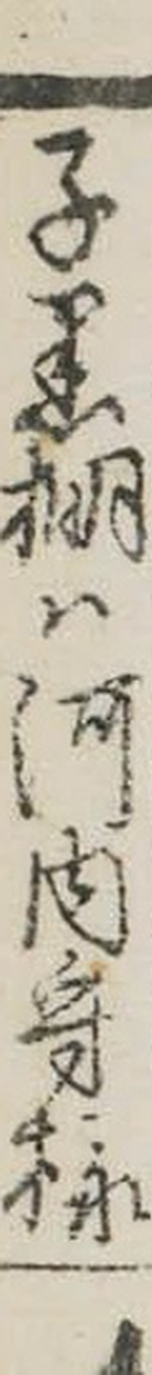子黒棚は河内守様
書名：女大学
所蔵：東京学芸大学教育コンテンツアーカイブ
